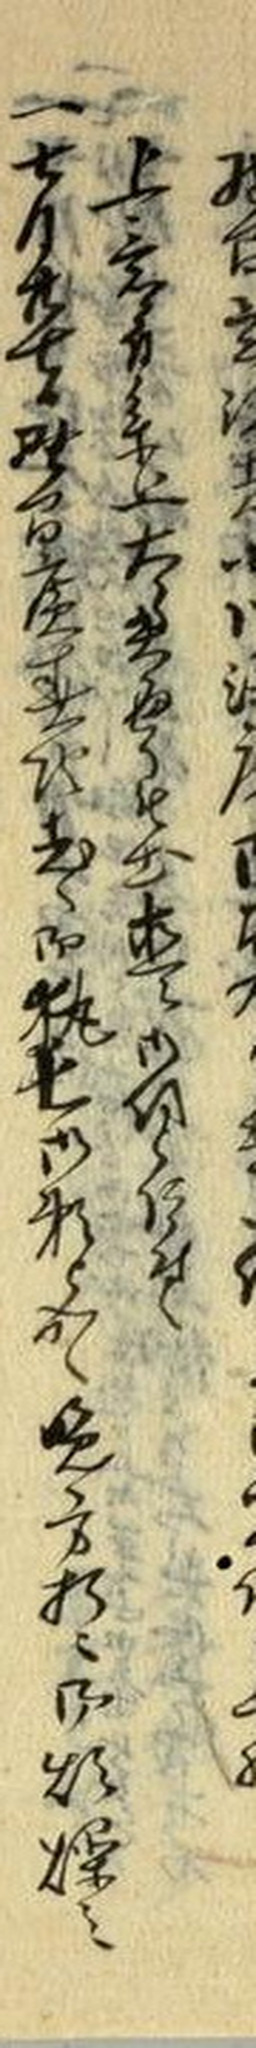一七月廿七日野間広春院老へ御執匙御頼被成候晩方折々御煩燥之
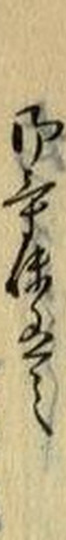御気味有之
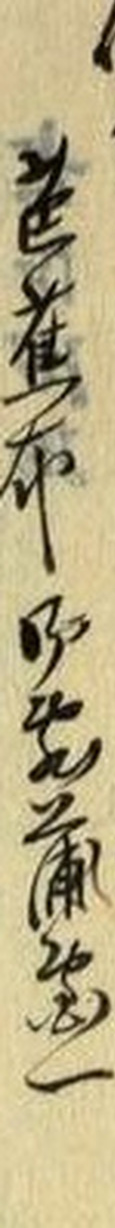芭蕉布御敷蒲団一
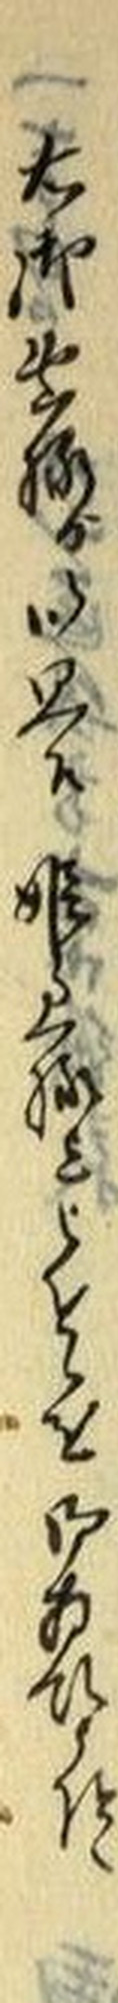右御台様ゟ以思召姫君様迄被進候を御拝領被遊候
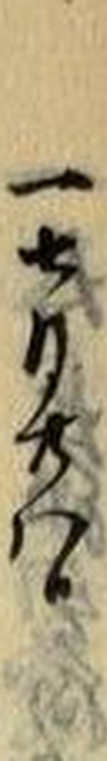一七月廿八日
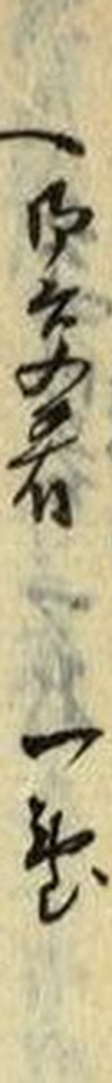御交肴一台
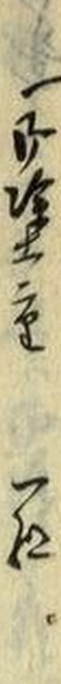御塗重一組
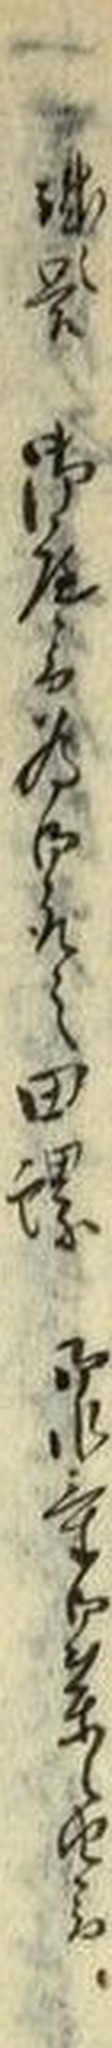城之思召御庭ニ而為御取之田螺御水気御薬之由ニ而
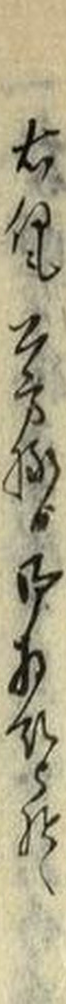右何も公方様ゟ御拝領被遊候
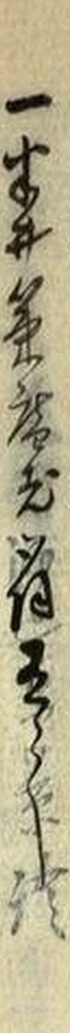一半井策庵老御伺有之
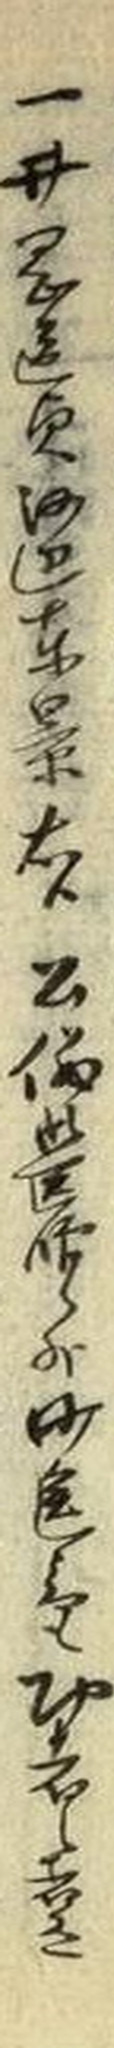一井岡道貞河辺東景右ハ公儀御医師之外町医ニ而も切者之者有
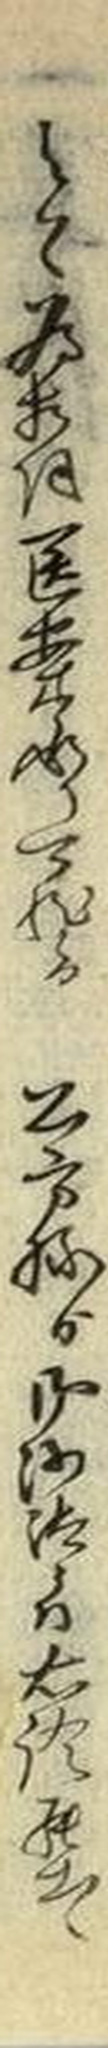之候ハヽ為相伺医案承り可然旨公方様ゟ御沙汰ニ付右診罷出候
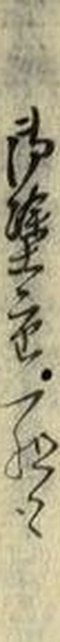御塗重一組ツヽ
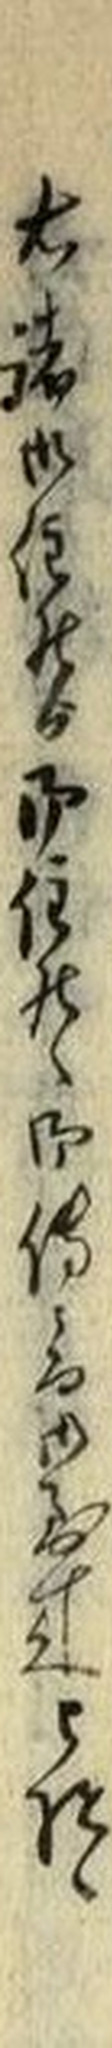右諸御住居ゟ御住居へ御伝ニ而御到来被遊候
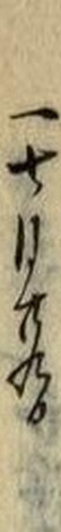一七月廿九日

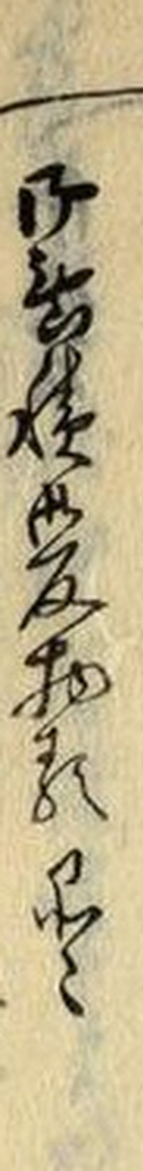御台積御反物類品々
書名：少傅日録抄（斉承付側向頭取日記、在府）
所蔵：福井県文書館 Fukui Prefectural Archives
